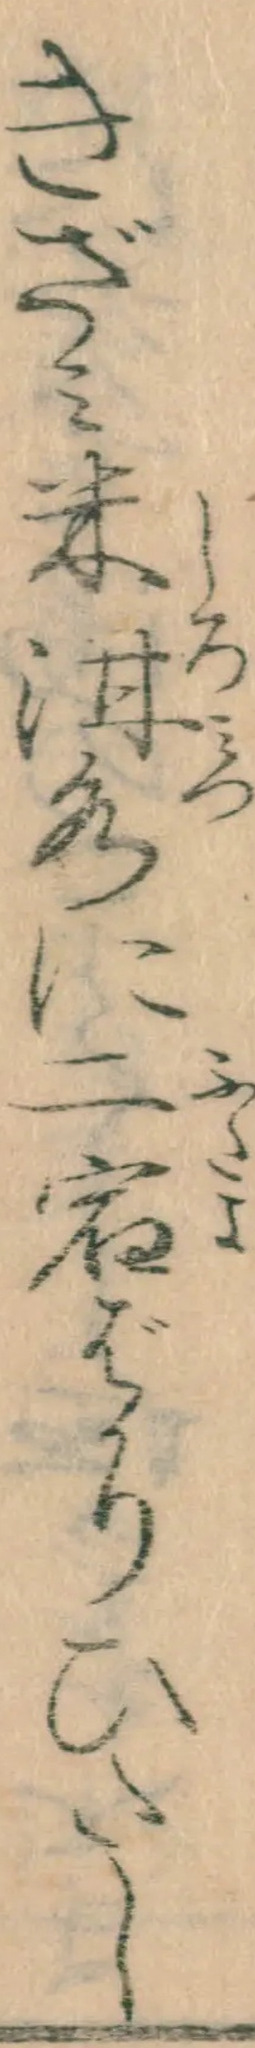きざみ米泔水に二宿ばかりひたし
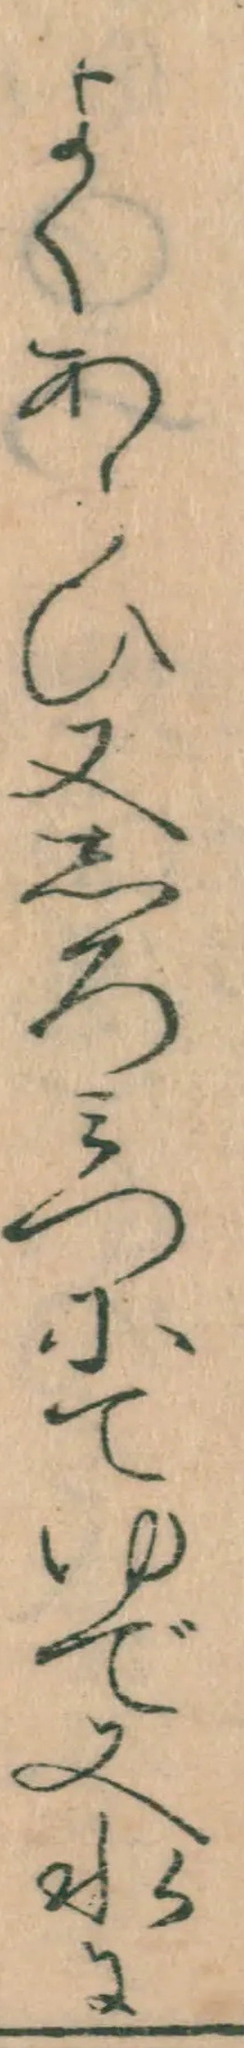よくあらひ又しろみつにてゆで又水に
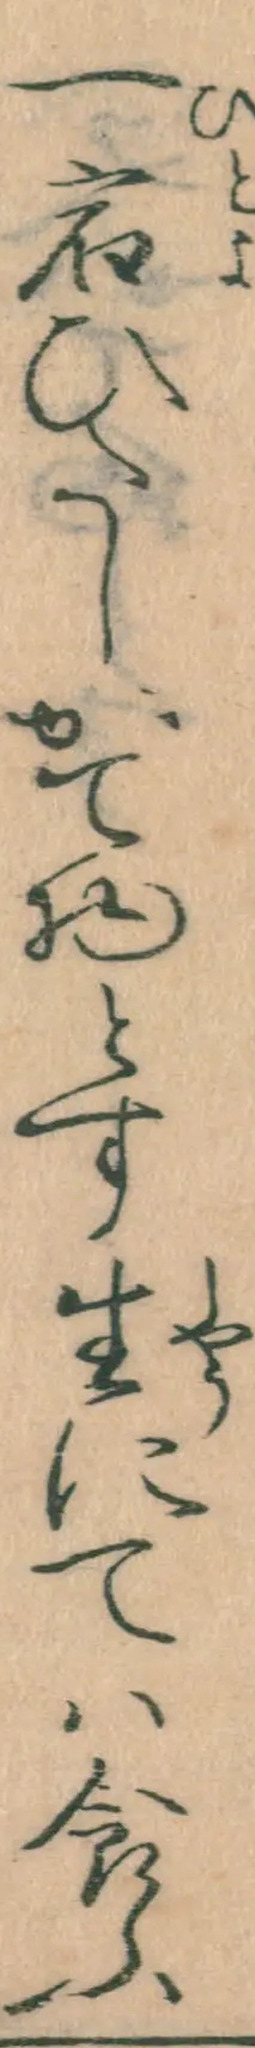一宿ひたしかて物とす生にては食ふ
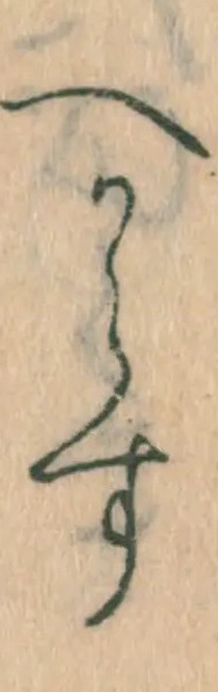へからす
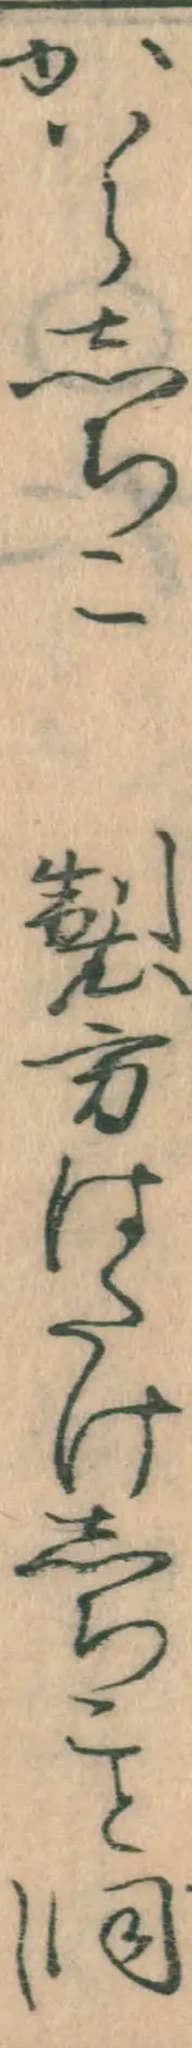かはらしちこ製方はたけしちこと同し
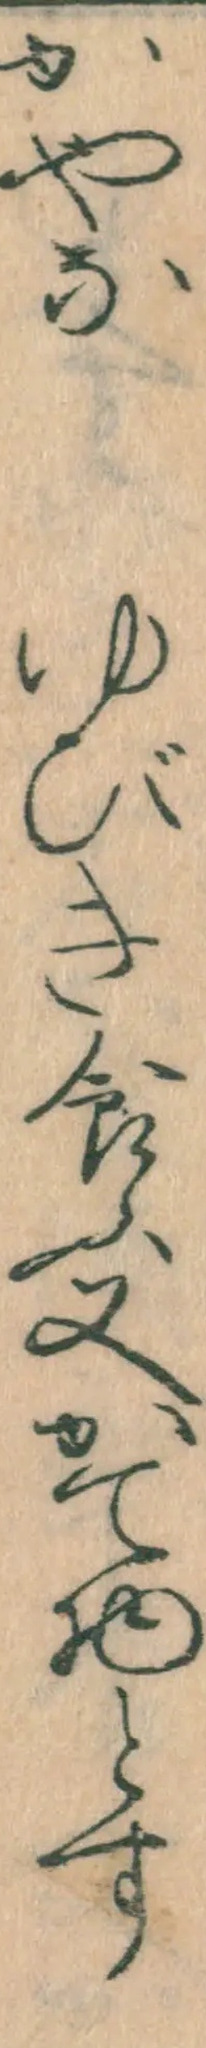かやなゆびき食ふ又かて物とす
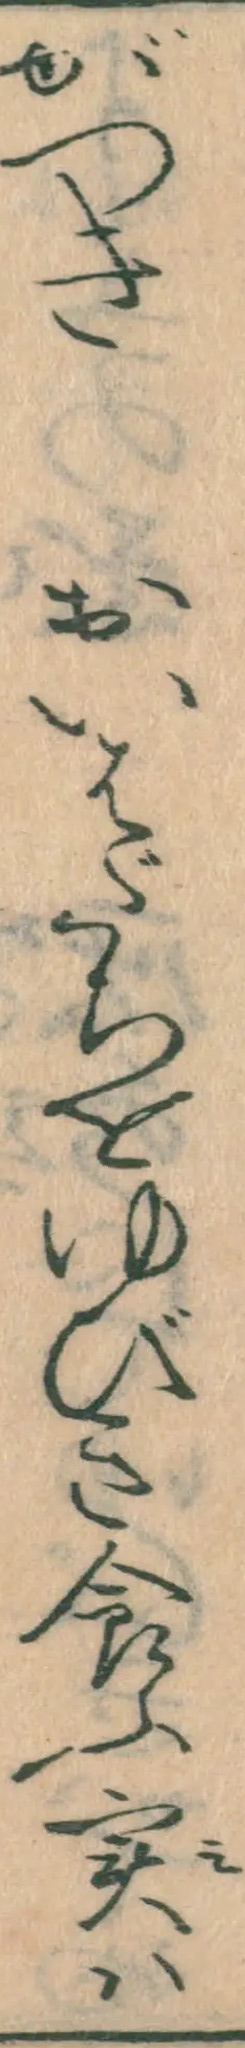がつきおいはだちをゆびき食ふ実は
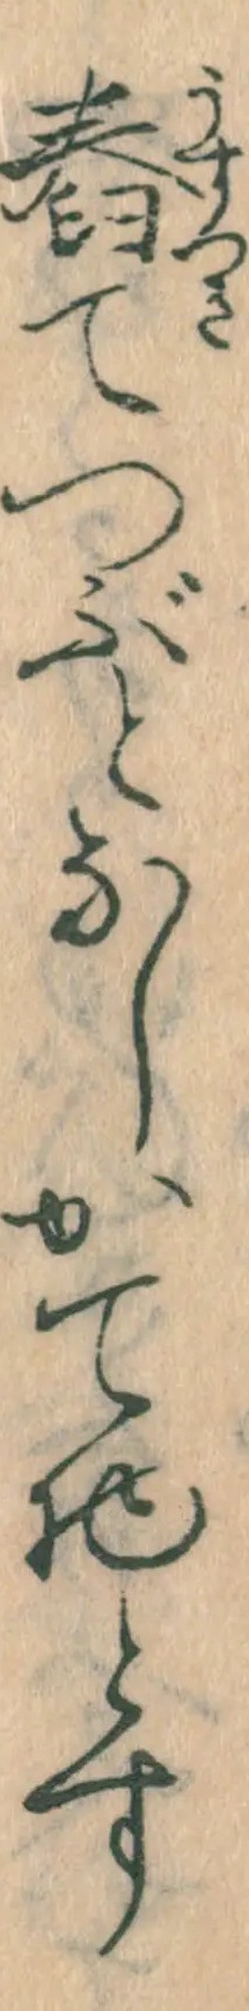舂てつぶとなしかて物とす

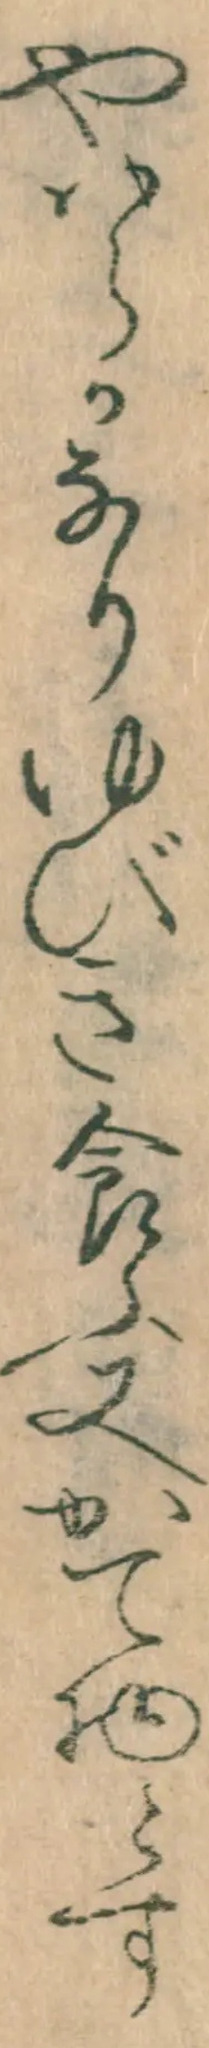やはらかなりゆびき食ふ又かて物とす
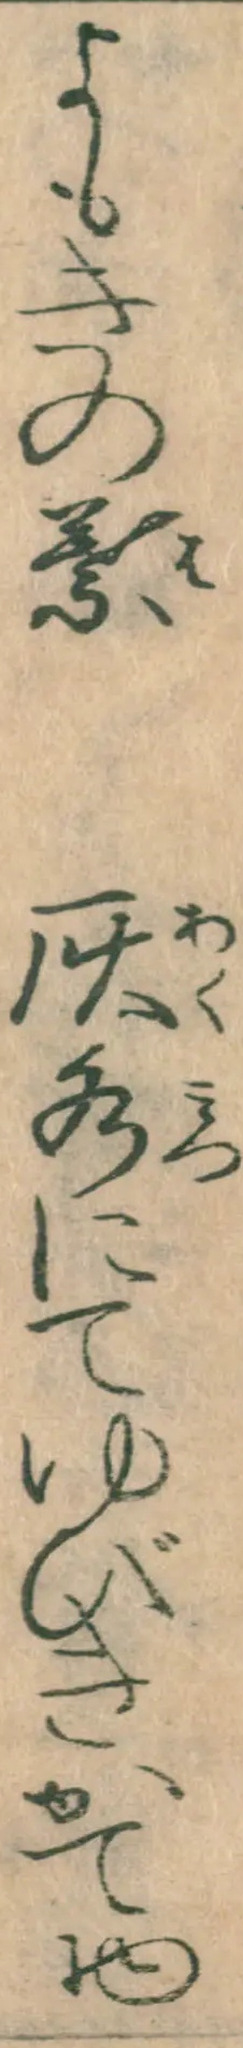よもきの葉灰水にてゆびきかて物
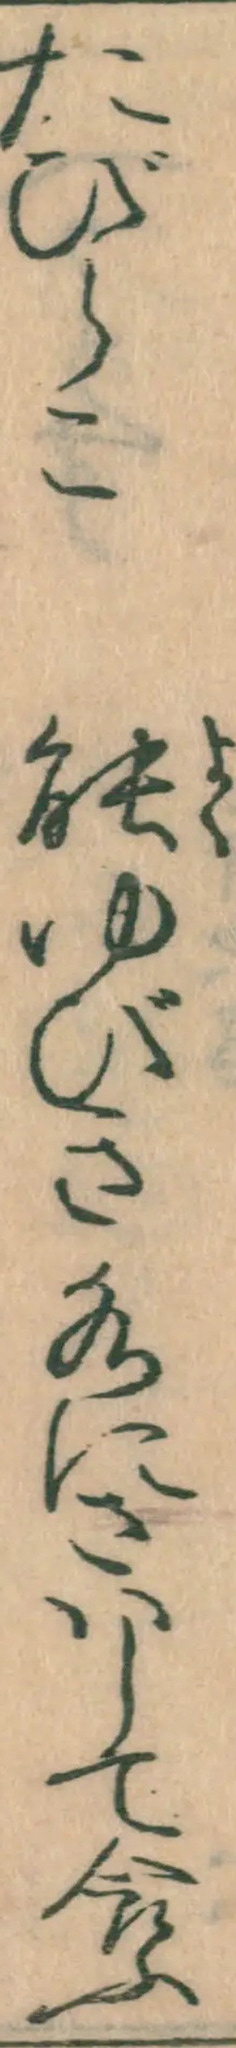たびらこ能ゆびき水にさはして食ふ
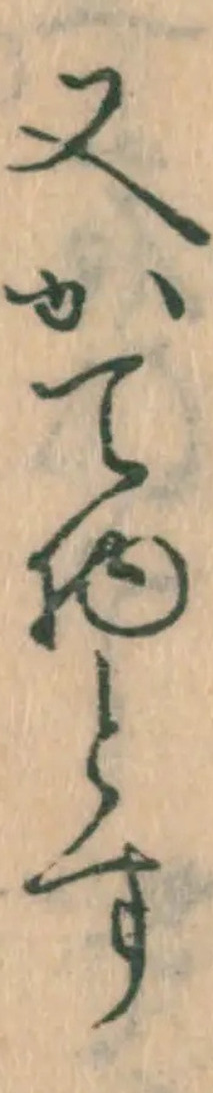又かて物とす
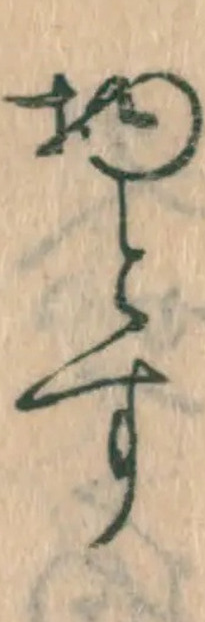物とす
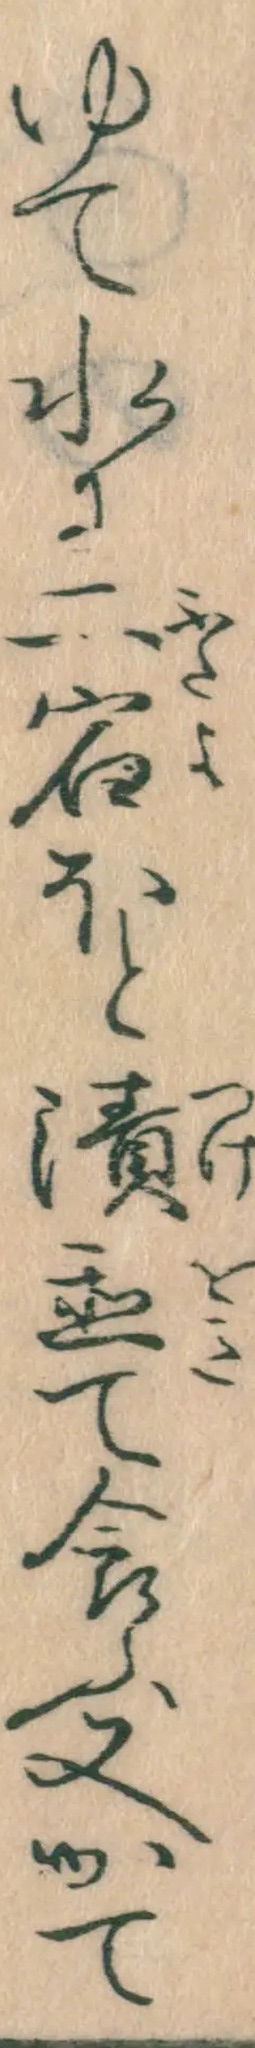ゆて水に二宿ほと漬置て食ふ又かて
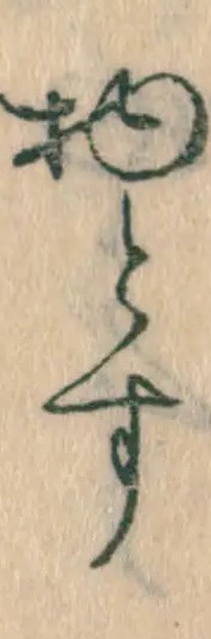物とす
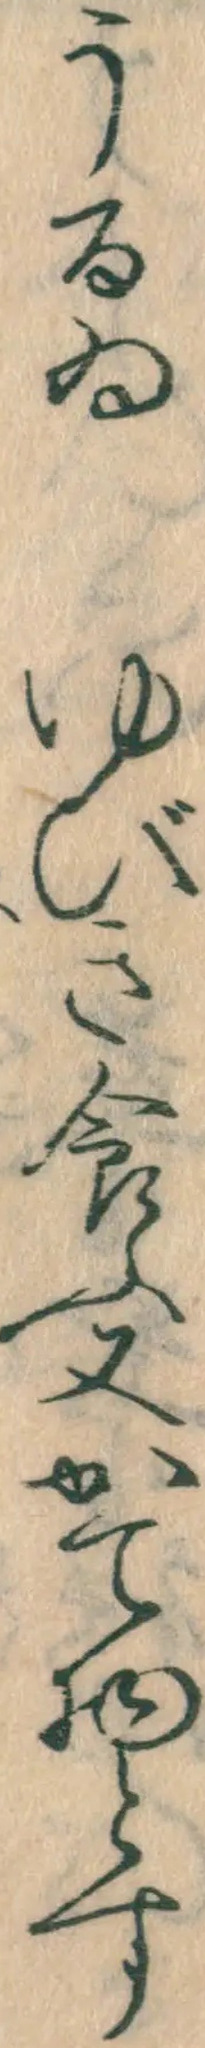うるゐゆびき食ふ又かて物とす
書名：かてもの
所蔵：国立国会図書館 National Diet Library, JAPAN
